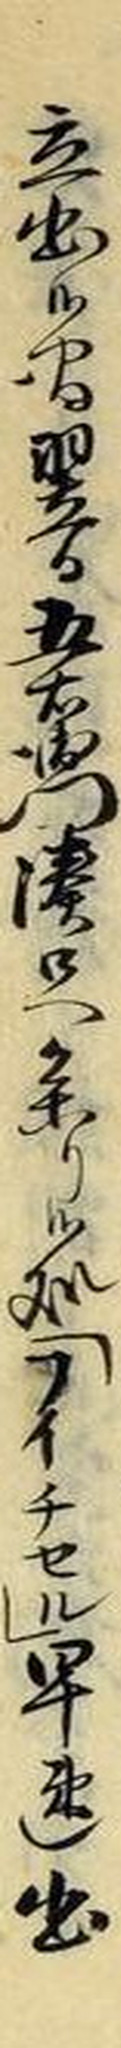立出候間翌日五右衛門湊口へ参り候処「フイチセル」早速出
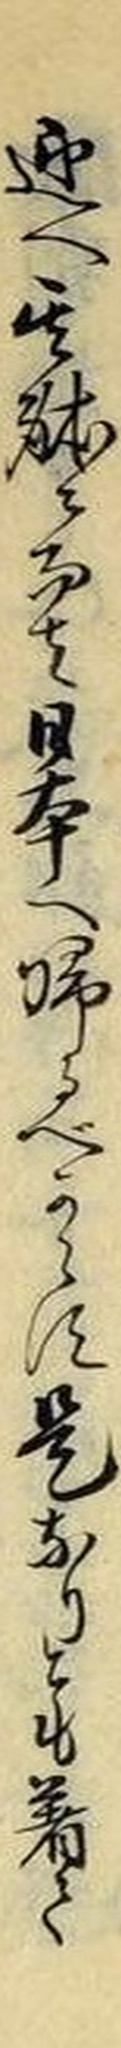迎へ其躰ニ而者日本へ帰るべからす是なりとも着て
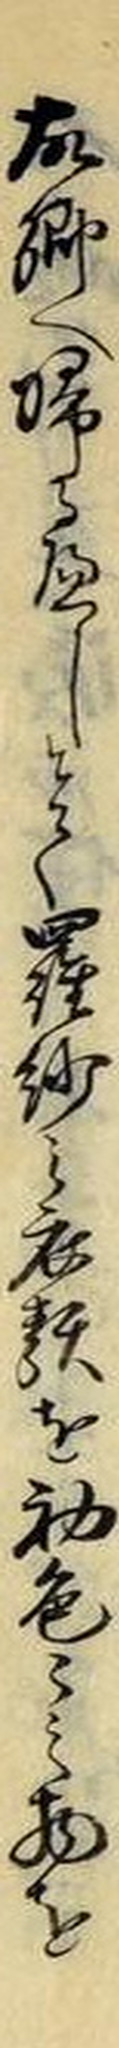故郷へ帰るへしとて羅紗之衣類を初色々之物を
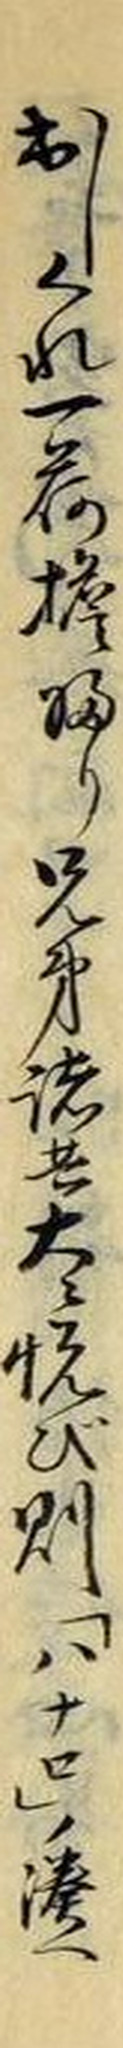出しくれ一荷担帰り兄弟諸共大二悦び則「ハナロ」ノ湊へ

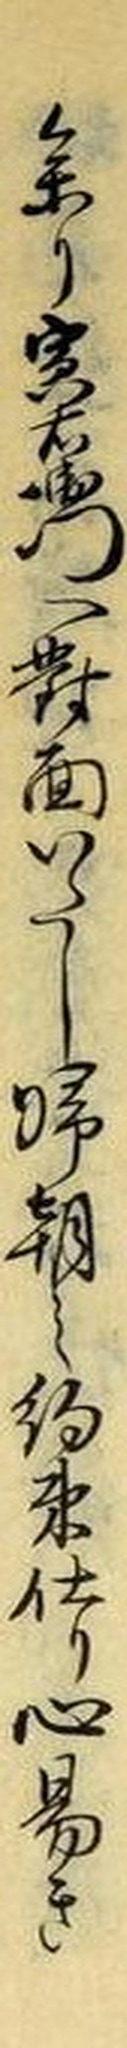参り寅右衛門へ対面いたし帰朝之約束仕り心易き
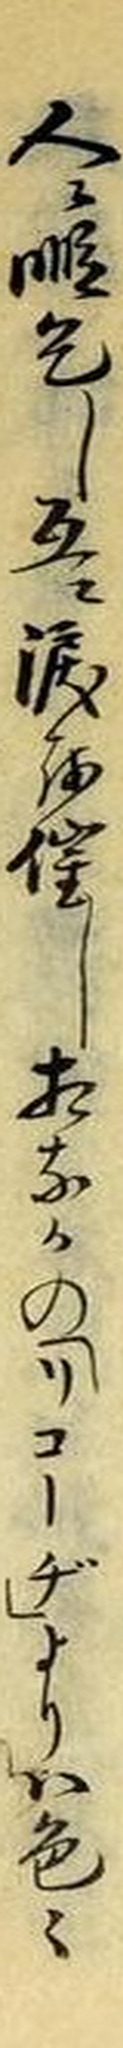人二暇乞し互ニ涙ら催し相なかの「リコーヂ」よりハ色々
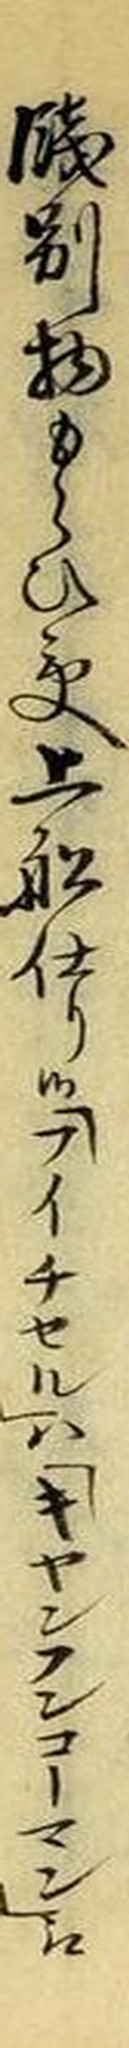餞別物もらひ受上船仕り候「フイチセル」ハ「キヤンフンコーマン」へ
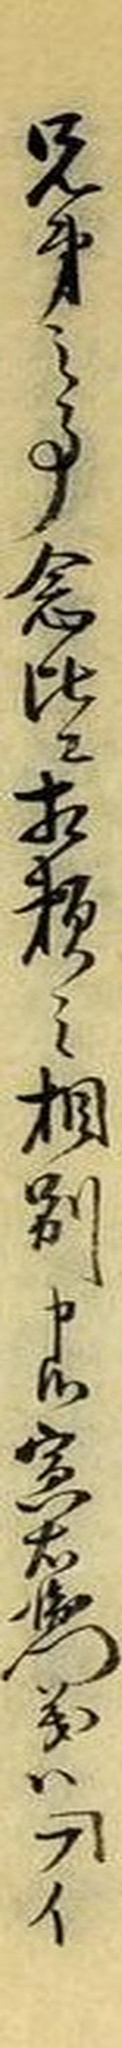兄弟之事念頃二相頼ミ相別申候寅右衛門義ハ「フイ
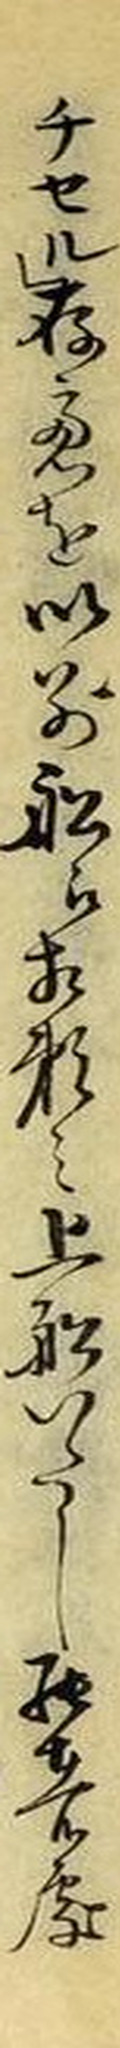チセル」存慮を以前船へ相頼ミ上船いたし罷在候處
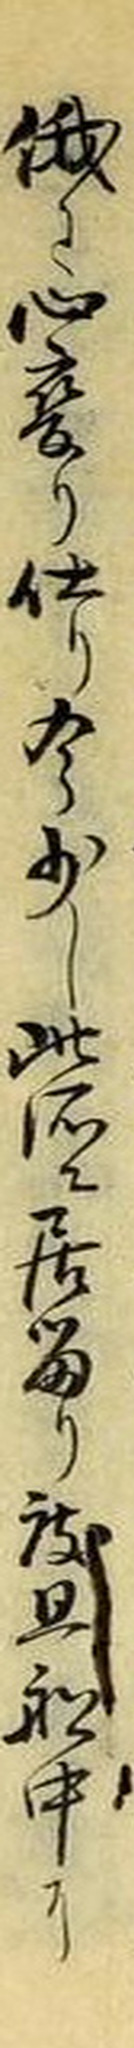俄に心変り仕り各少し此所ニ居留り度且船中に
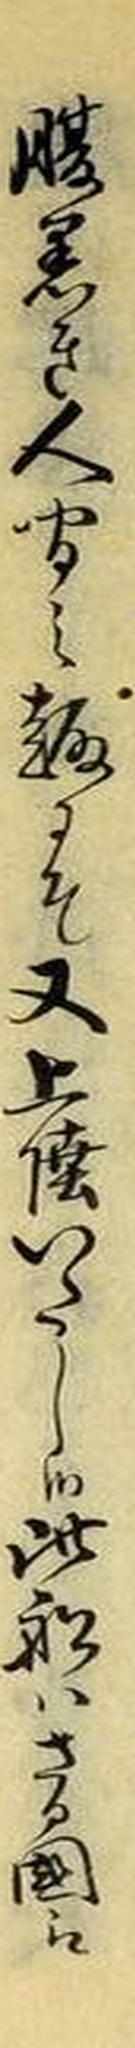腹黒き人間之趣にそ又上陸いたし候此船ハさる国へ
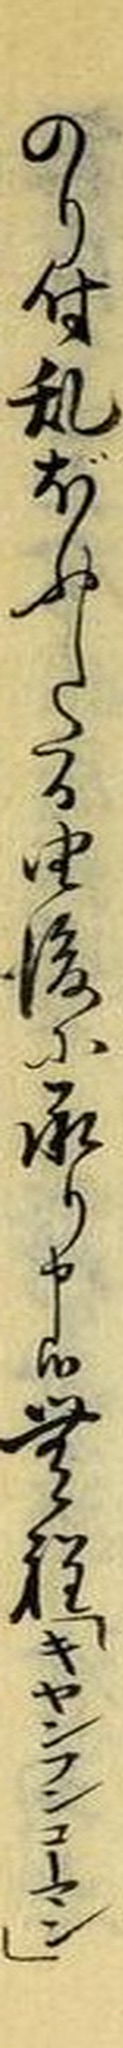のり付乱ぼふしたる由後に承り申候無程「キヤンフンコーマン」
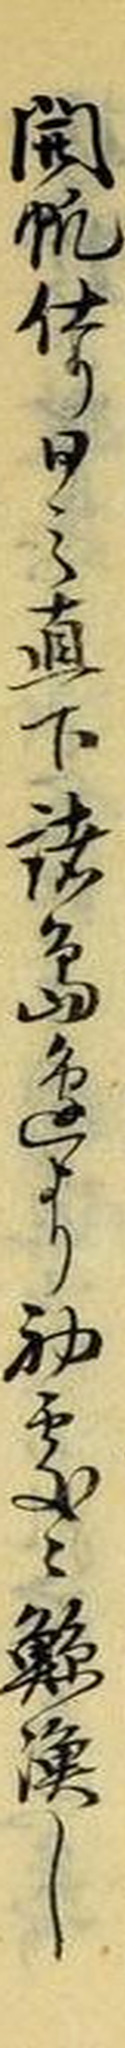開帆仕り日之直下諸島辺より初そと鯨漁し
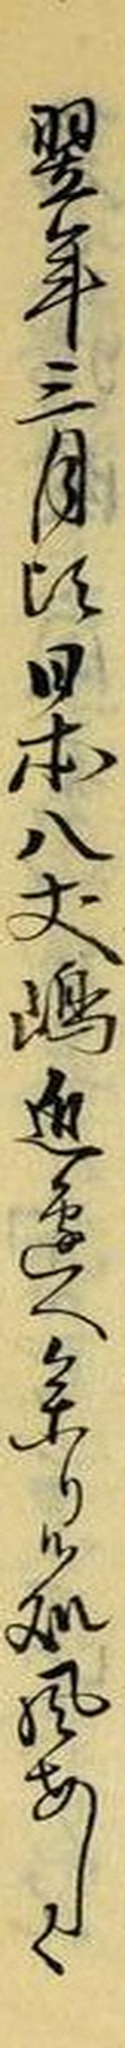翌年三月頃日本八丈島近辺へ参り候処風あしく
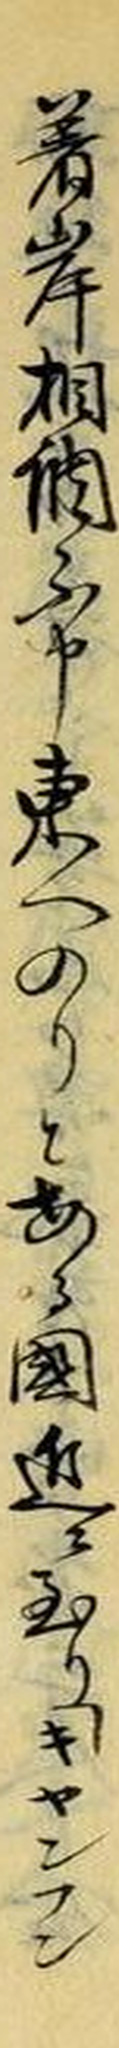着岸相調ふ申東へのりとある国近ニ至り「キヤンフン
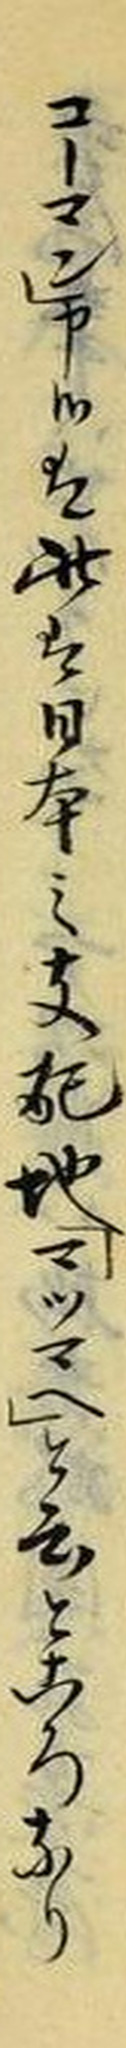コーマン」申候は此は日本之支配地「マツマへ」と云ところなり
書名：漂客談奇（備考雑録写8）
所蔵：福井県文書館 Fukui Prefectural Archives
